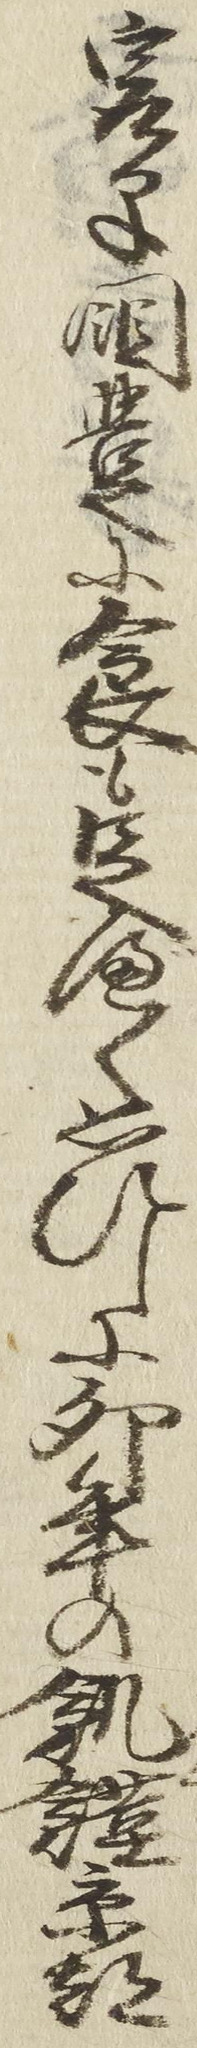最早国豊に食も足べく思ひしに卯年の飢饉京都
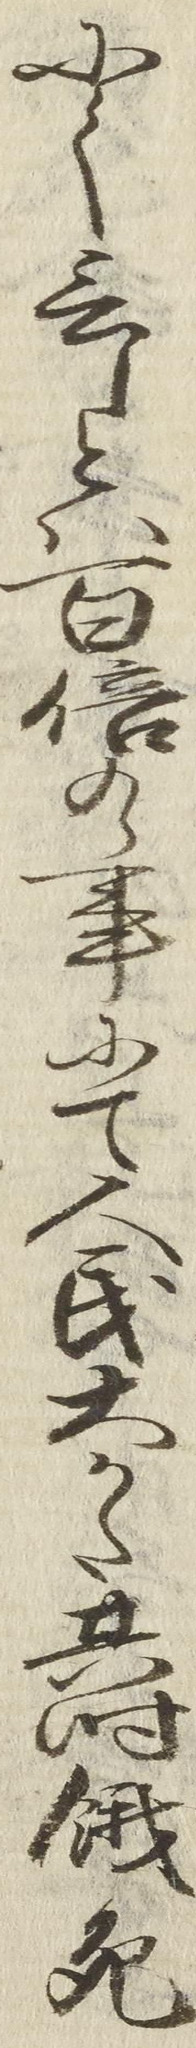にて言しとは百倍の事にて人民大かた其時餓死
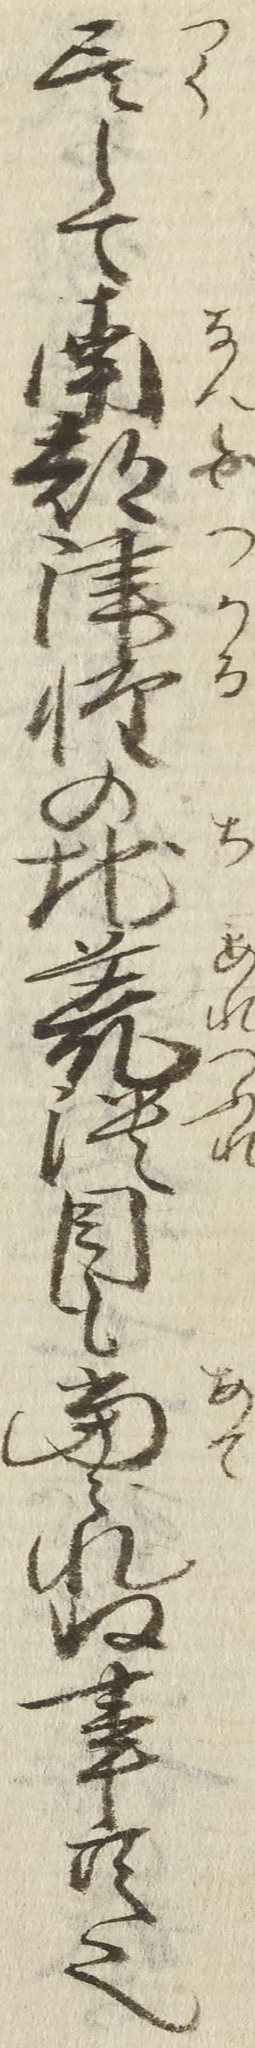尽して南部津軽の地荒潰目も当られぬ事共也
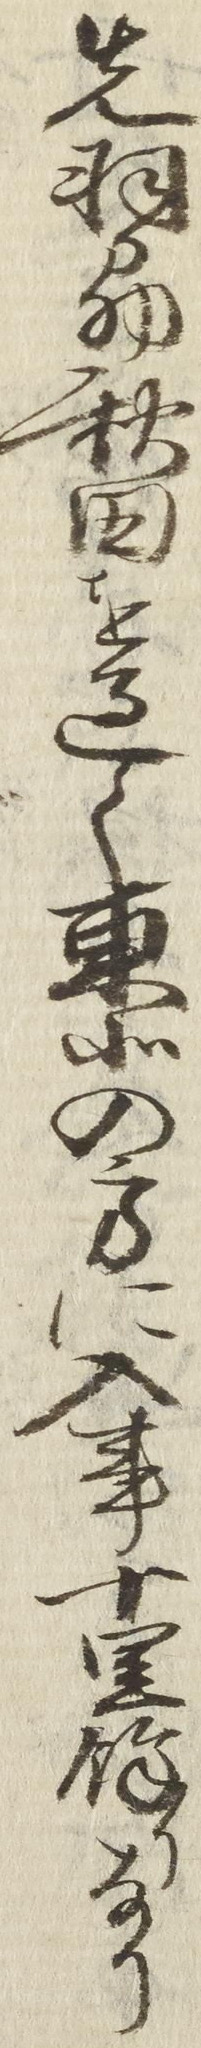先羽州秋田を過て東北の方に入事十里余りなり
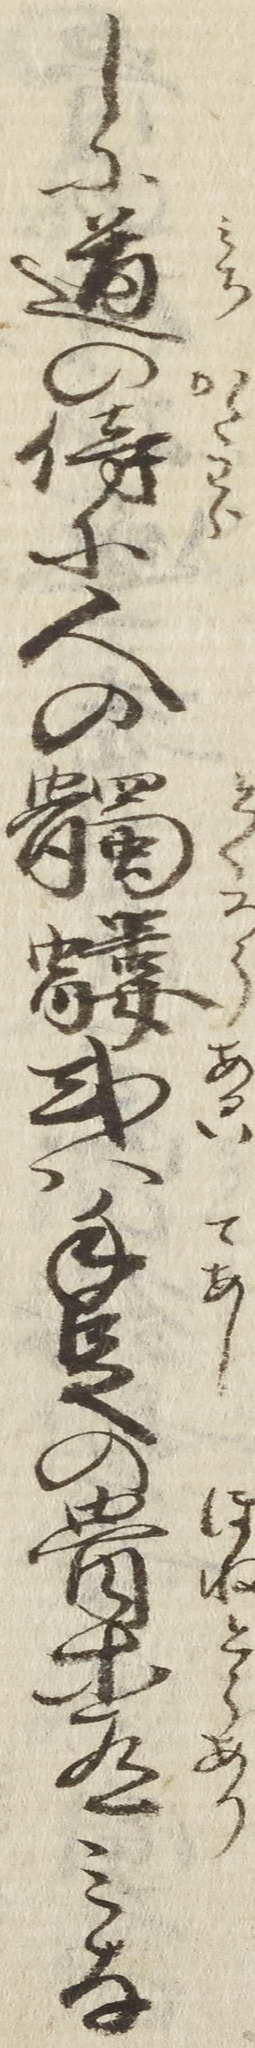しに道の傍に人の髑髏或は手足の骨等有みな
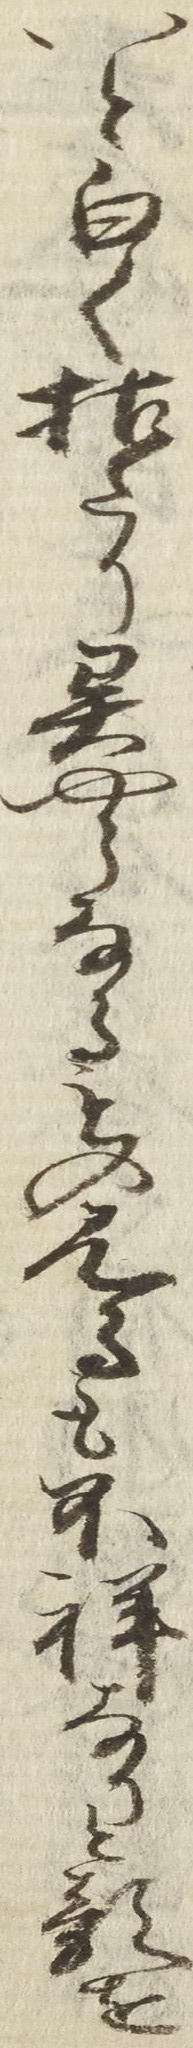いと白く枯たり異やうなるもの見るも不祥なりと顔を
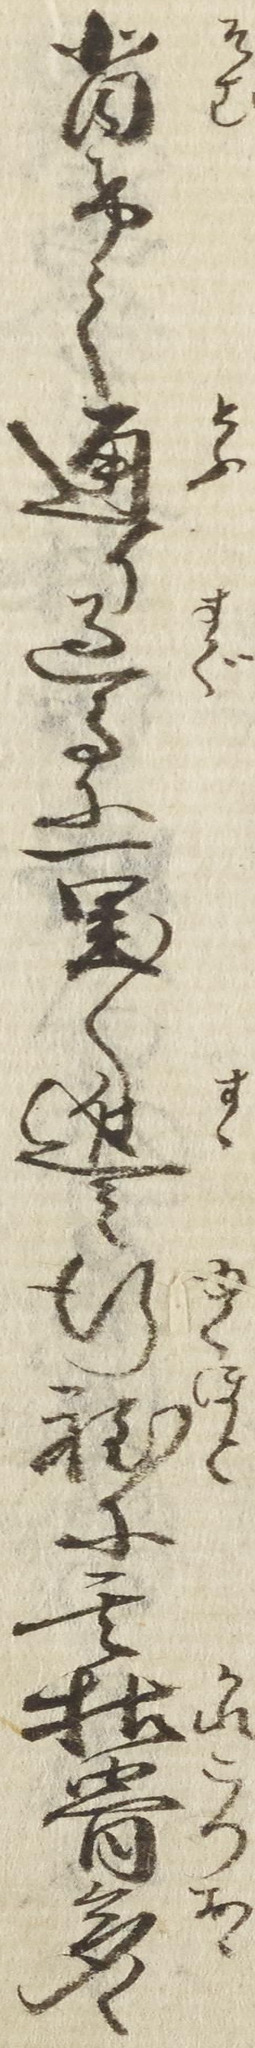背けて通り過るに一里〳〵進み行程に其枯骨多く
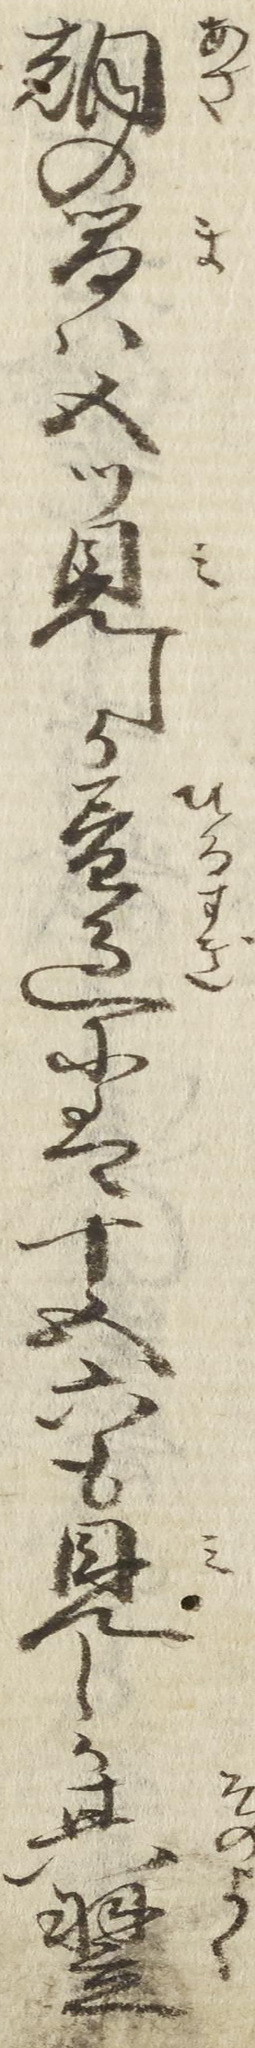朝の間は五ツ見しか昼過には十五六も見しか其翌
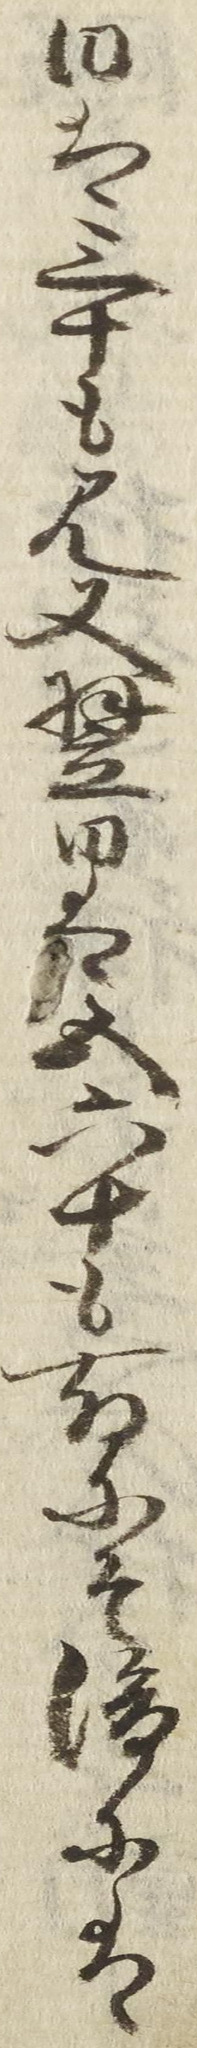日は三十も見又翌日は五六十も有にそ後には

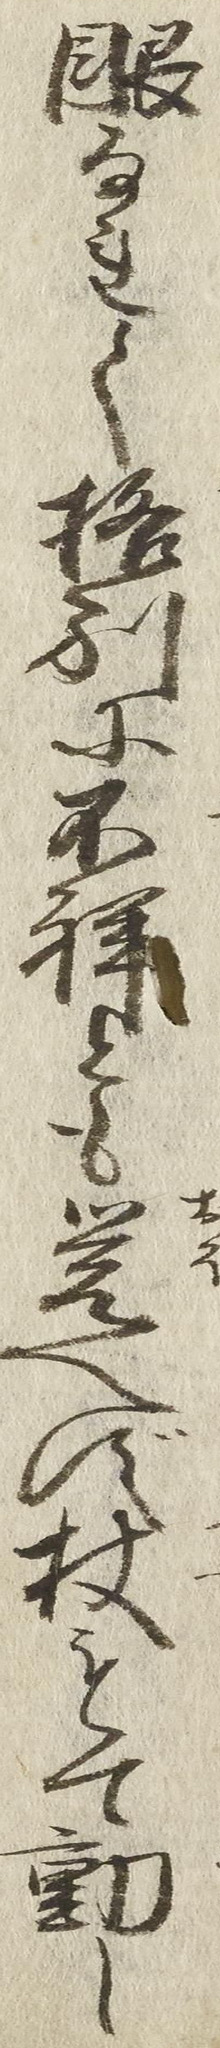眼なれて格別に不祥とも覚へず杖もて動し
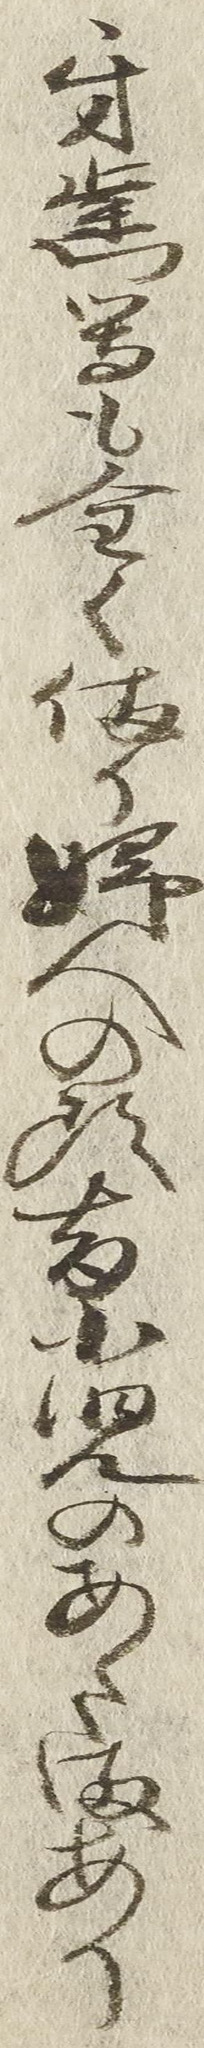牙歯等も全く備り婦人の頭有小児のあたまあり
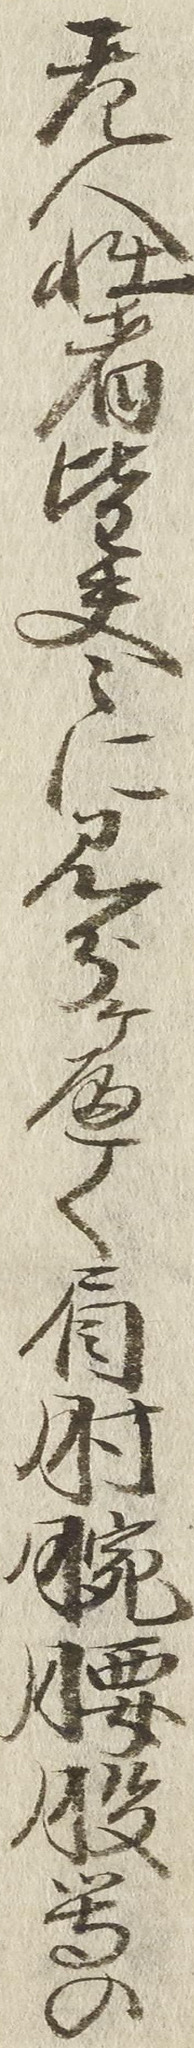老人壮者皆夫〻に見分ケへく眉肘腕腰股等の
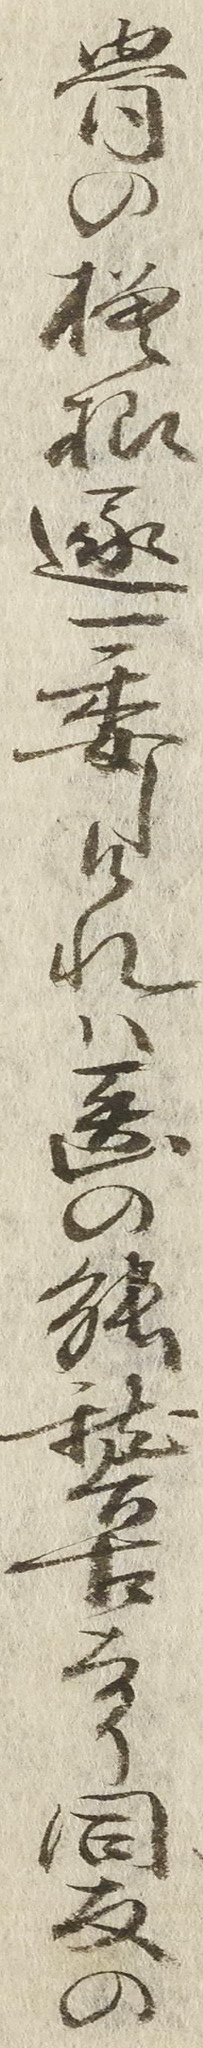骨の模様逐一委しけれは医の能稽古なり同友の
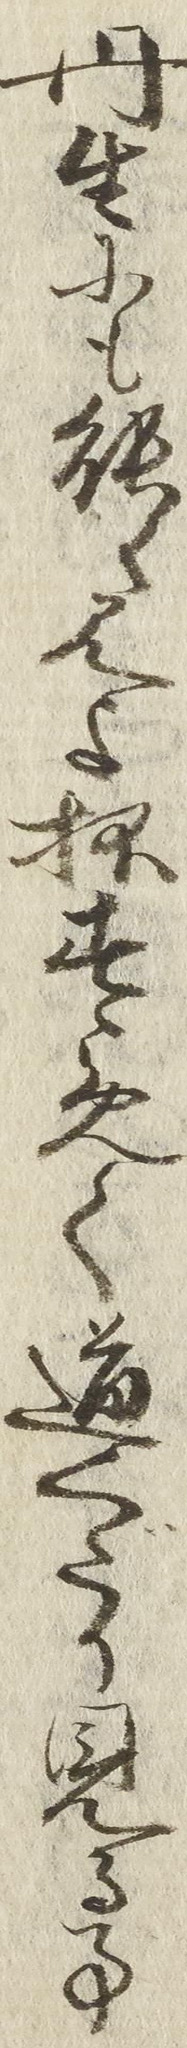丹生にも能〻見よ抔すゝめて道くだり見る事
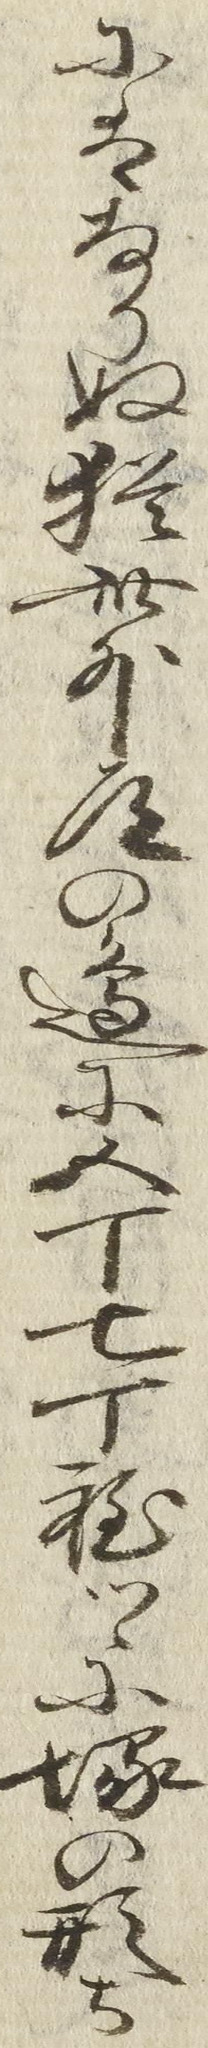にはなりぬ猶此外道の辺に五丁七丁程ツヽに塚の形ち
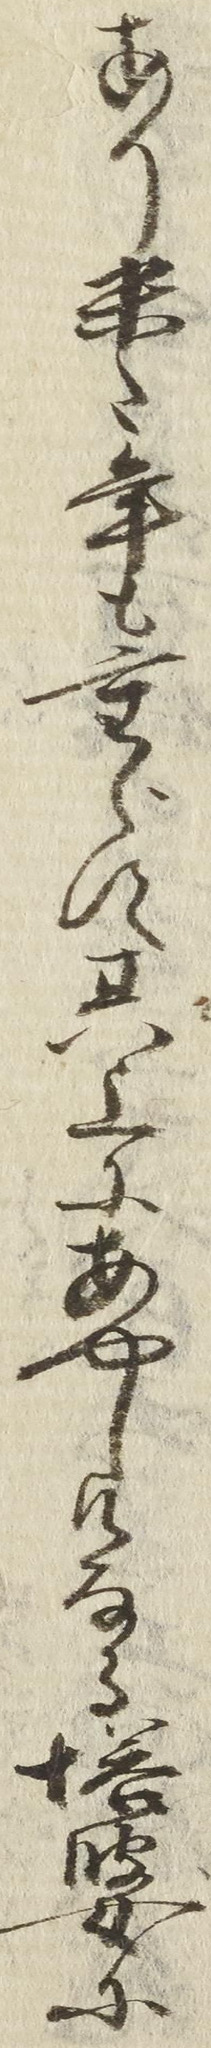あり未た年も重らす其上にあやしけなる塔婆に
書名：天明奇畧　全
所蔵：東京大学地震研究所図書室 Earthquake Research Institute Library, The University of Tokyo, JAPAN
